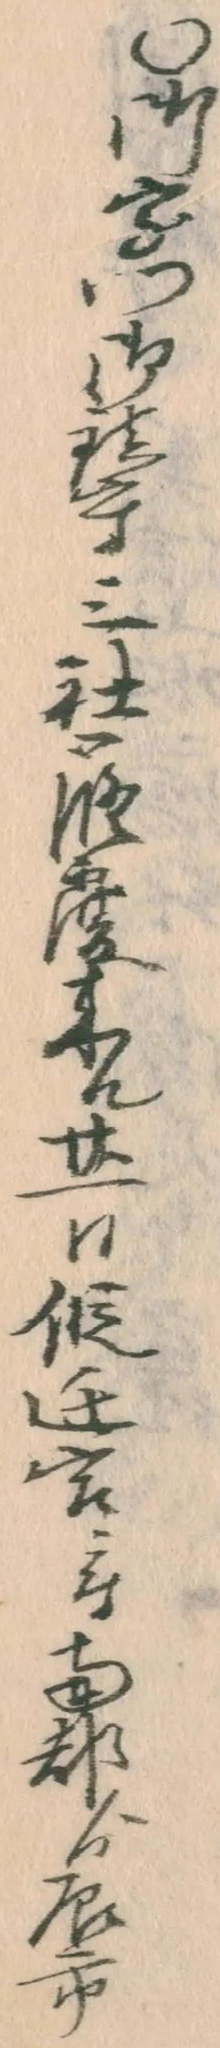○御家門御鎮守三社御修覆来ル廿一日仮遷宮ニ付南都ゟ辰市
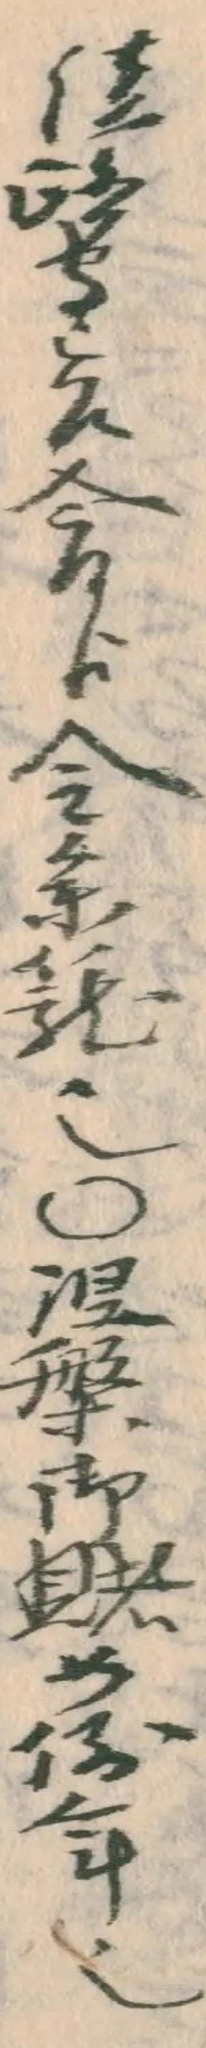淡路守被召今日ゟ令参籠也○涅槃御賭如例年也
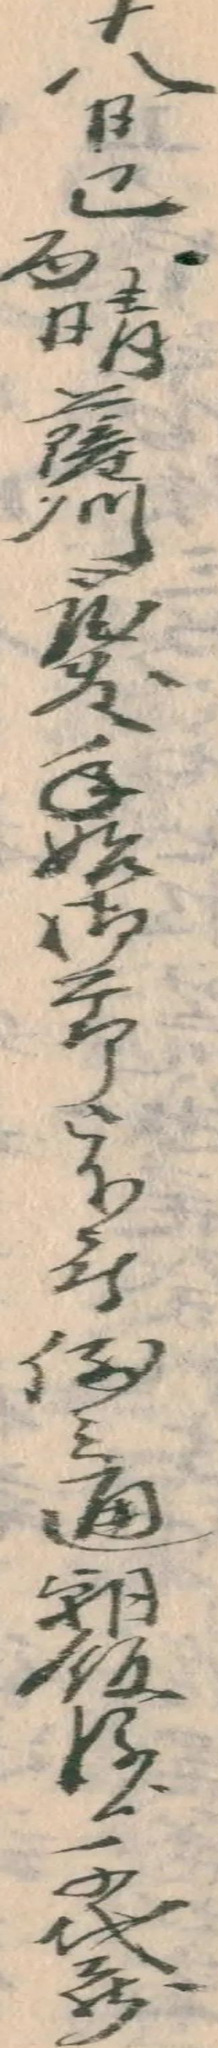十八日己酉晴薩州御屋敷年始御節被下候ニ付例之通朝飯後ゟ千代蔵
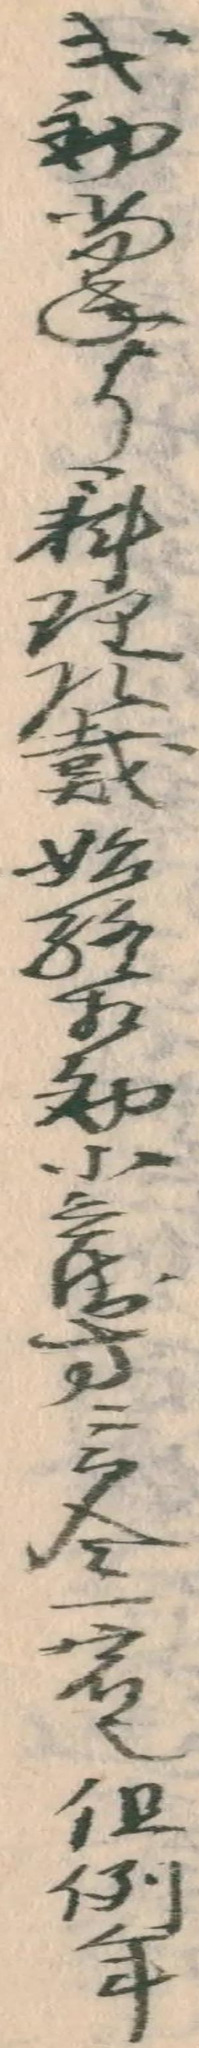出勤當年より御料理頂戴始終相勤小兵衛方ニ而令一宿也但例年
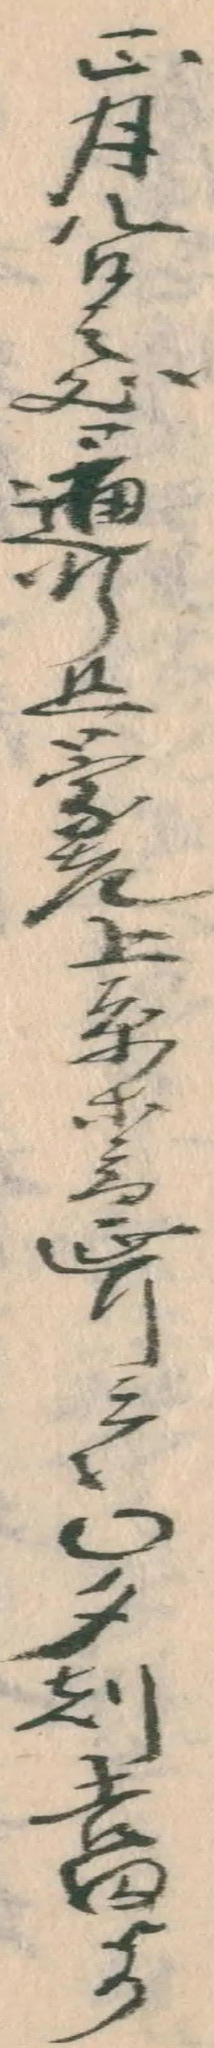正月八日之処御通行且蒙御家老上参等ニ而延引云々○夕刻吉田より
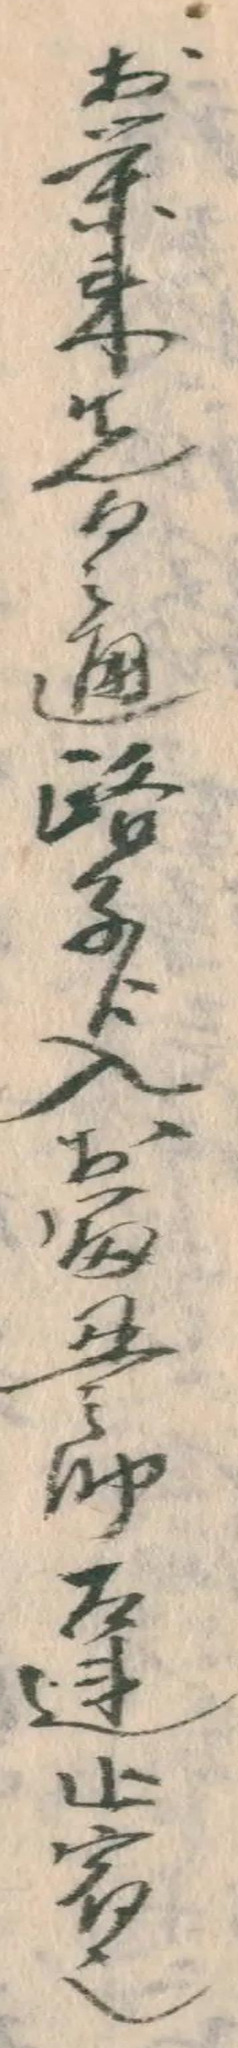お栄来先日之通路子ゟ入お冨丑之助召連止宿也
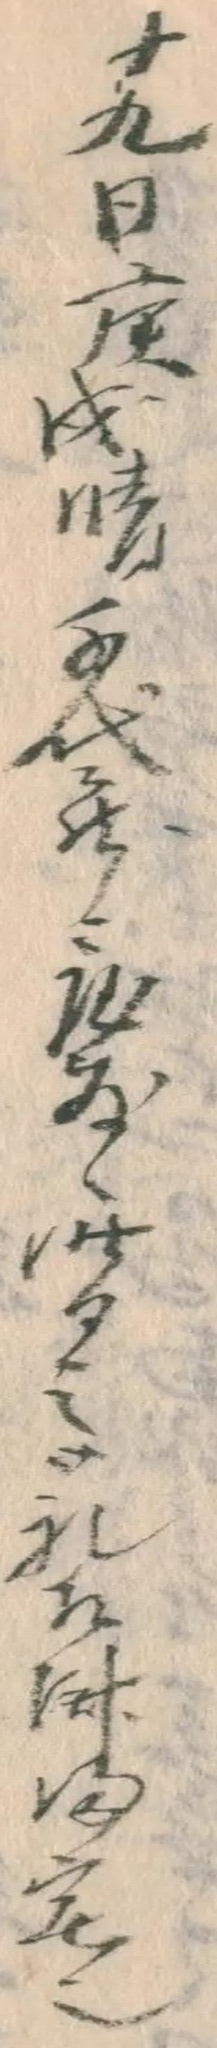十九日庚戌晴千代蔵御屋敷候昨日之御礼相済帰宅也
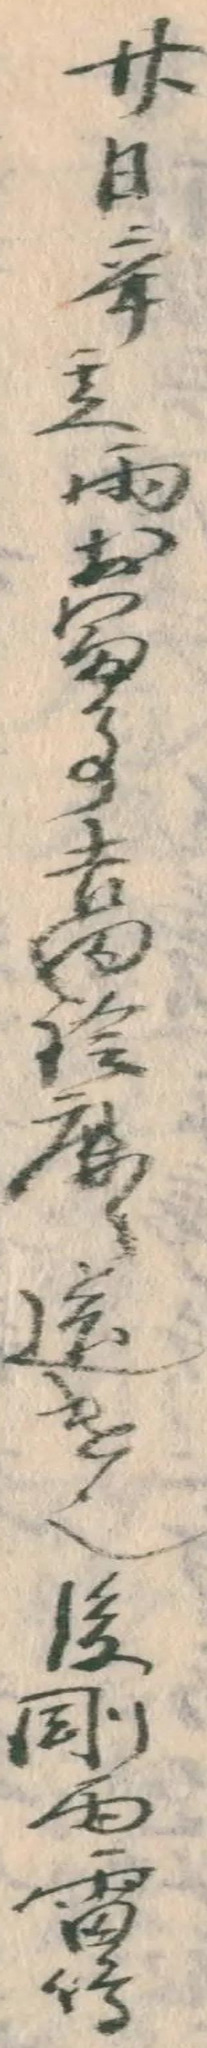廿日辛亥雨お富事吉田鈴鹿ヘ送遣也後剛雨雷鳴
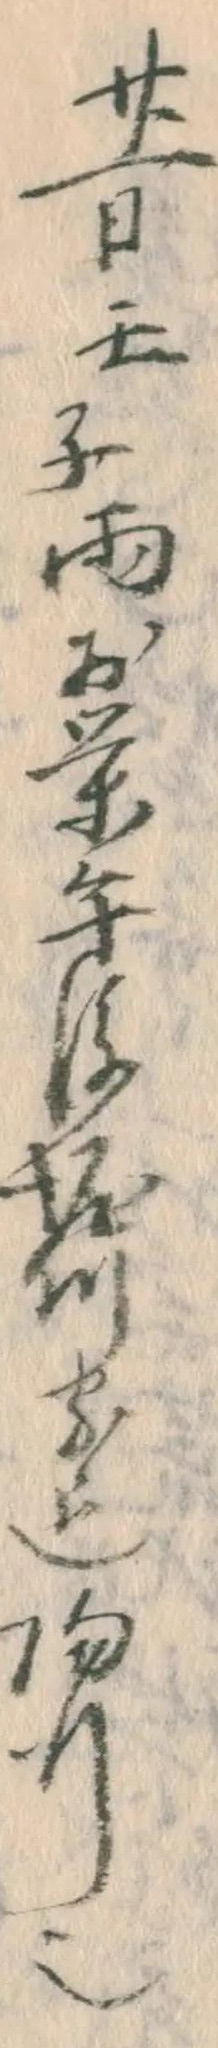廿一日壬子雨お栄午後堀川宿迄帰行也
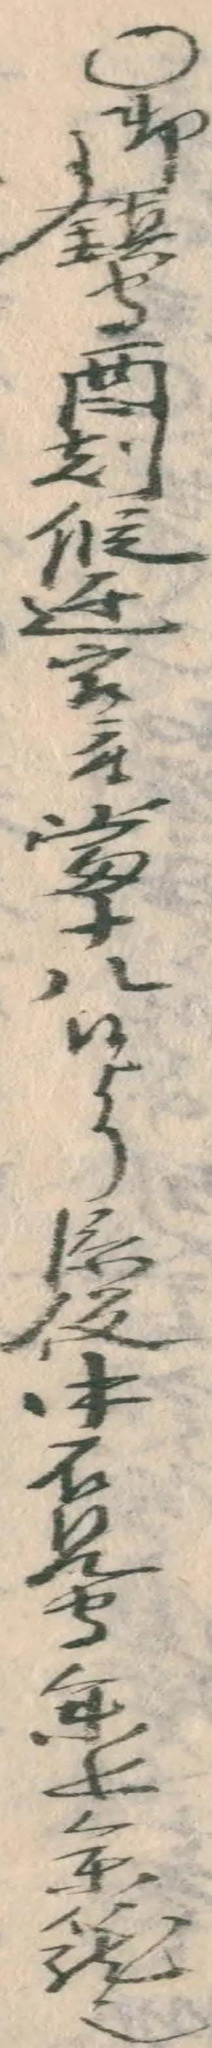○御鎮守酉刻假遷宮ニ付當十八日より添役中石見守参上参籠也
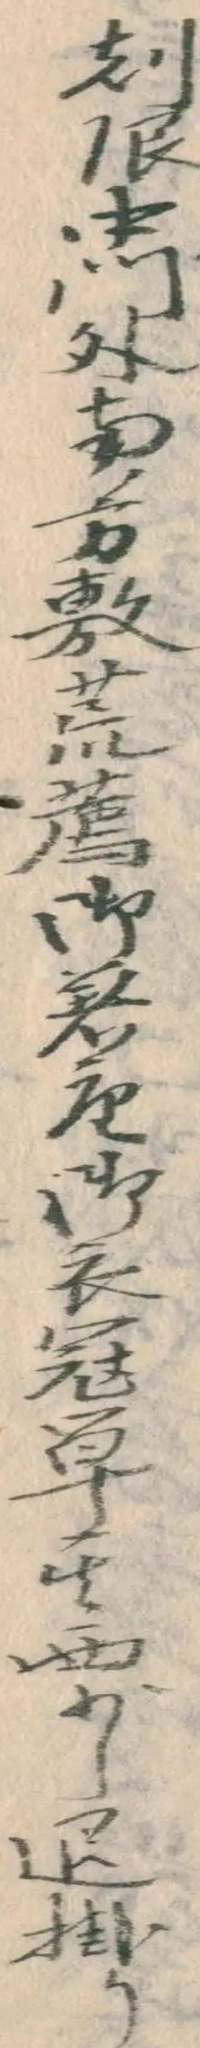刻限中門外南ノ方敷荒薦御着座御衣冠単草其西少し退掛り
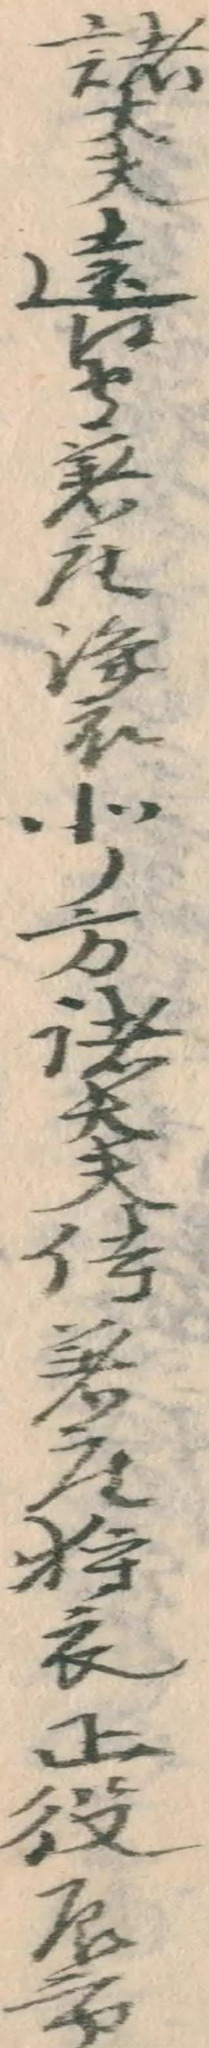諸大夫遠江守着座浄衣北ノ方諸大夫侍着座狩衣正役辰市
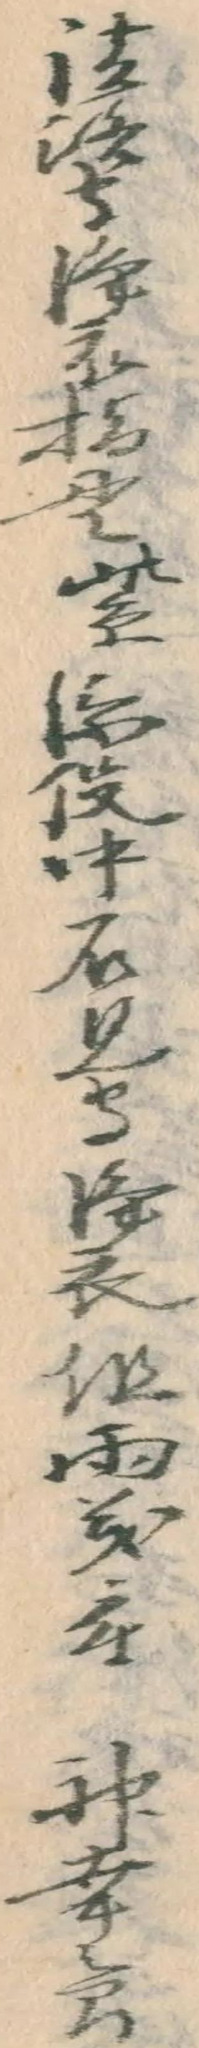淡路守浄衣指貫紫添役中石見守浄衣但雨義ニ付神幸之間

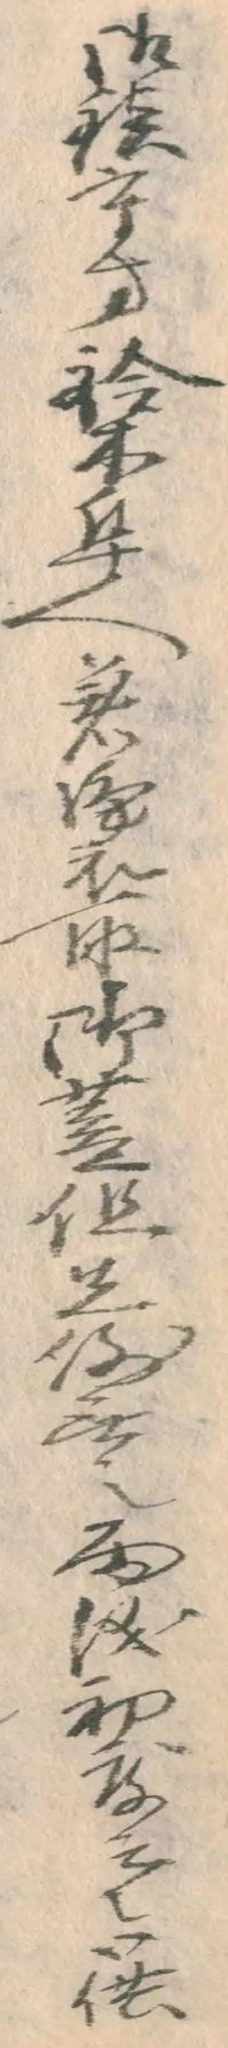御鎮守方鈴木隼人着浄衣取御蓋但先例無之雨議初度云々御供
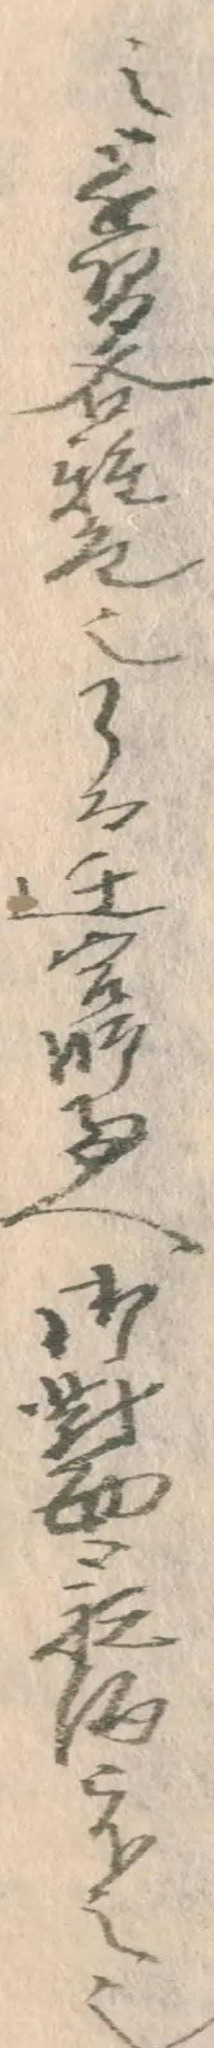之御近習各雑色也了而遷宮師両人御對面御祝酒被下之也
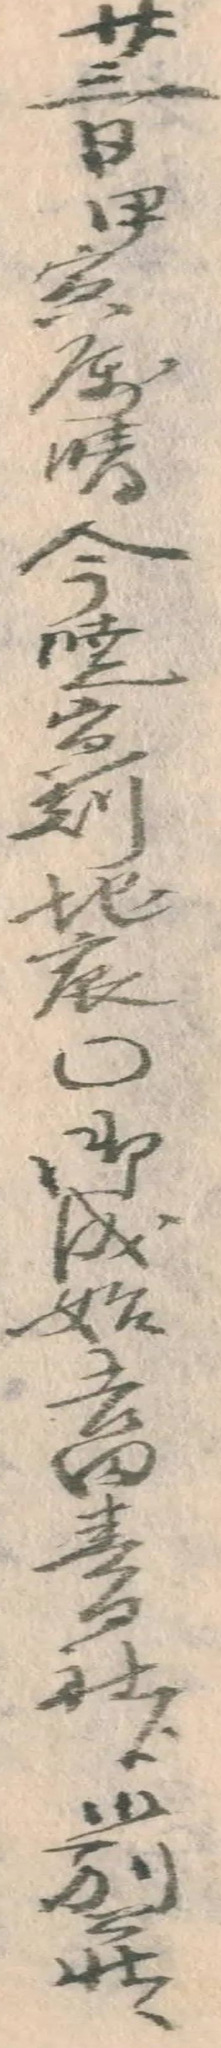廿三日甲寅属晴今暁方刻地震〇御成始吉田春日社ゟ御別荘ヘ
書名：賀茂社記録. 第70冊
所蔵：国立国会図書館 National Diet Library, JAPAN
